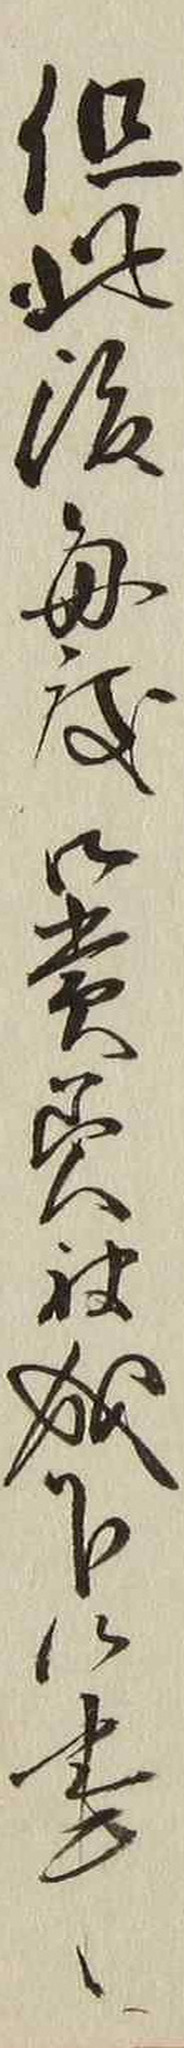但此後毎度御賞美被成下候事
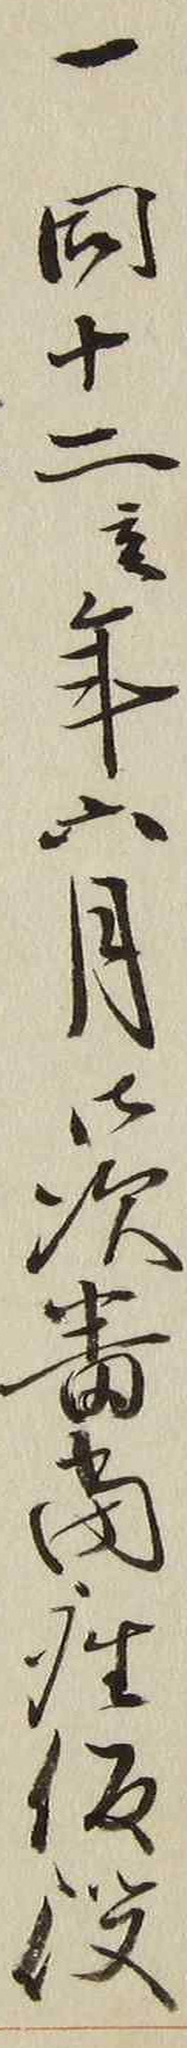一同十二亥年六月御次番当座仮役
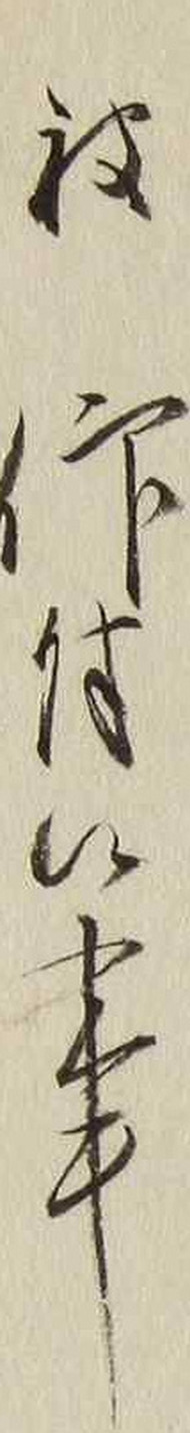被仰付候事
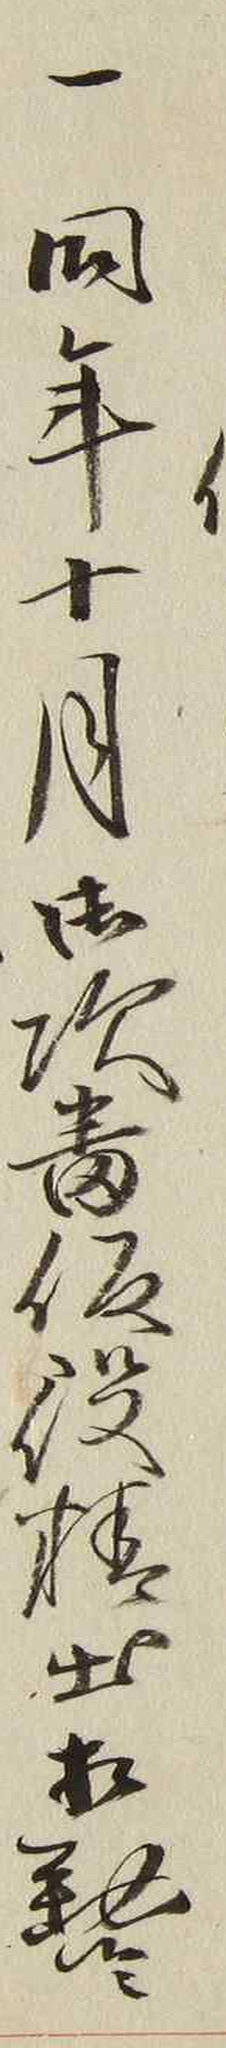一同年十月御次番仮役精出相勤候ニ
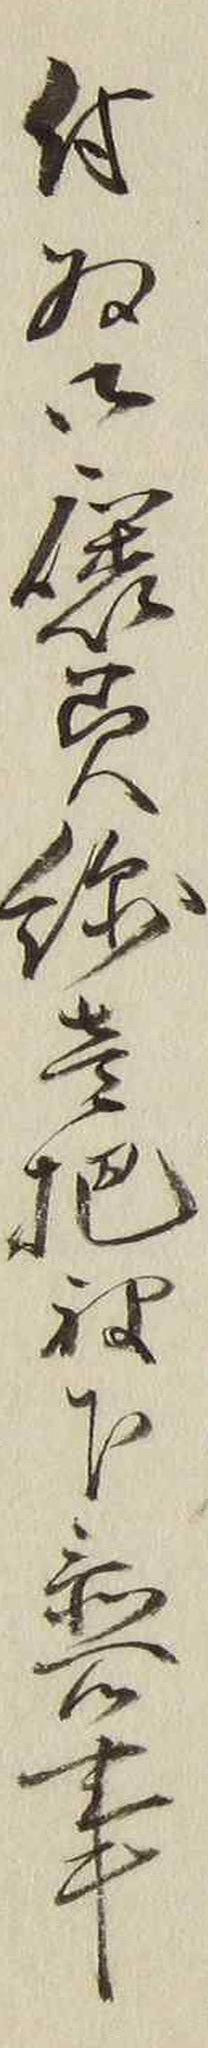付為御褒美綿壱把被下置候事
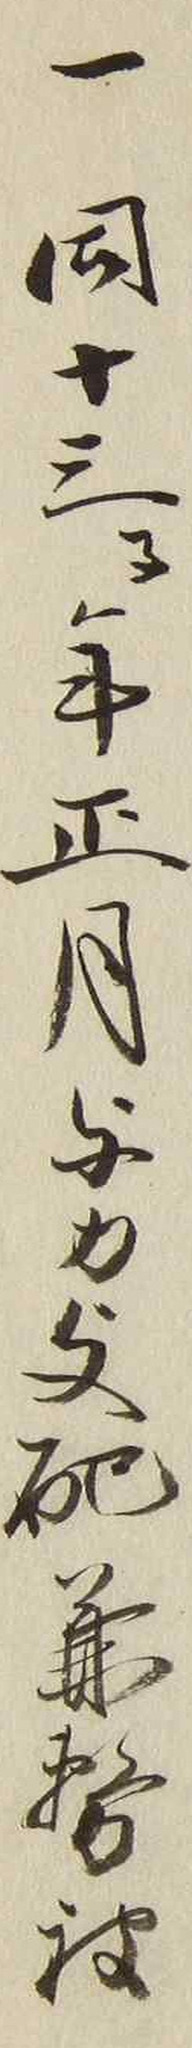一同十三子年正月与力支配兼務被

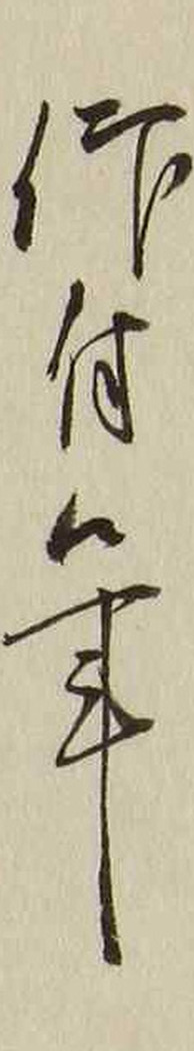仰付候事
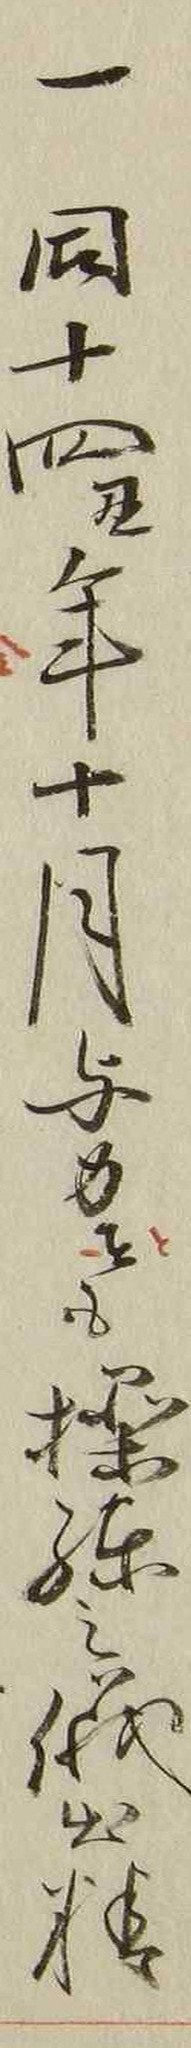一同十四辰年十月与力とも操練之儀出精
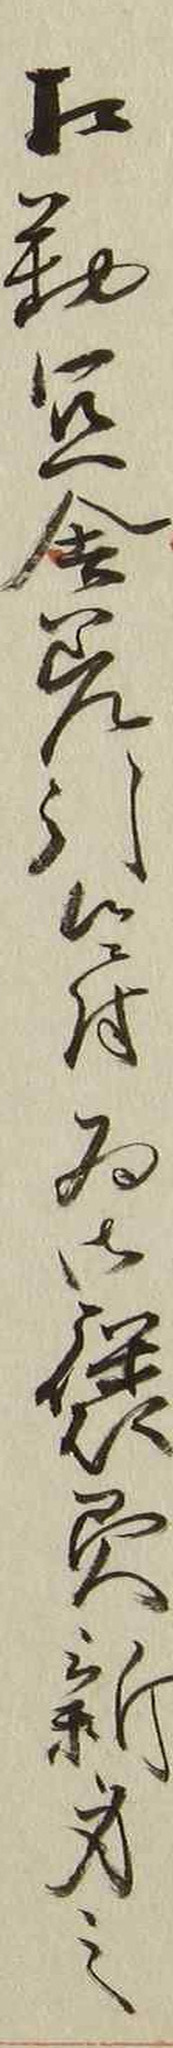相勤宜全差引候ニ付為御褒美新身之
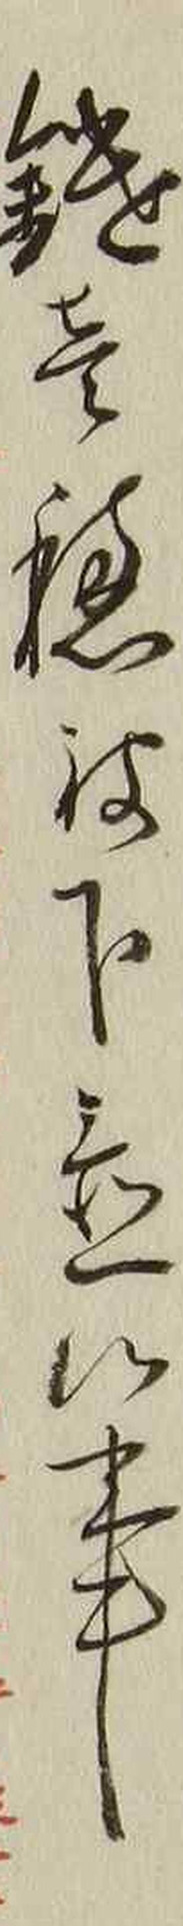鑓壱穂被下置候事
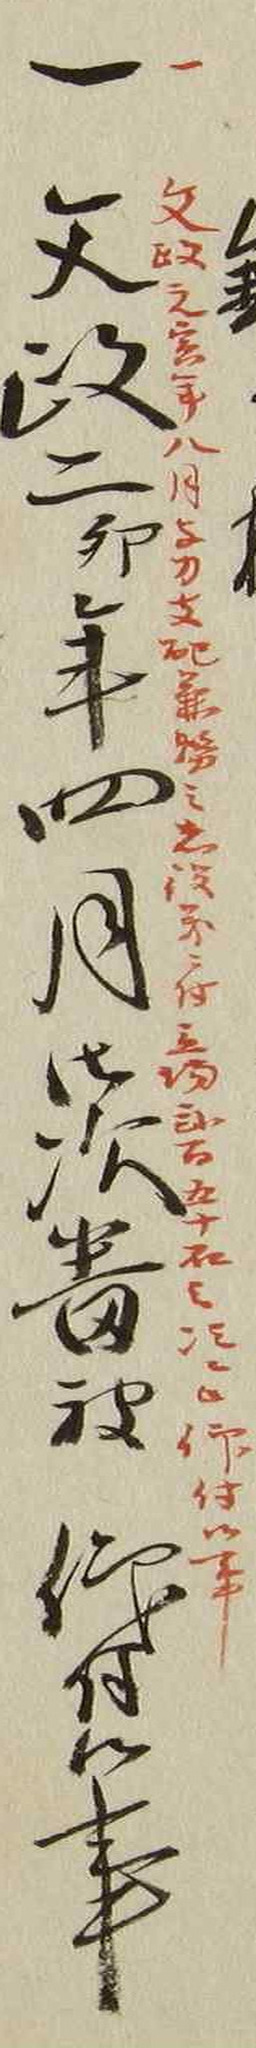一文政ニ卯年四月御次番被仰付候事
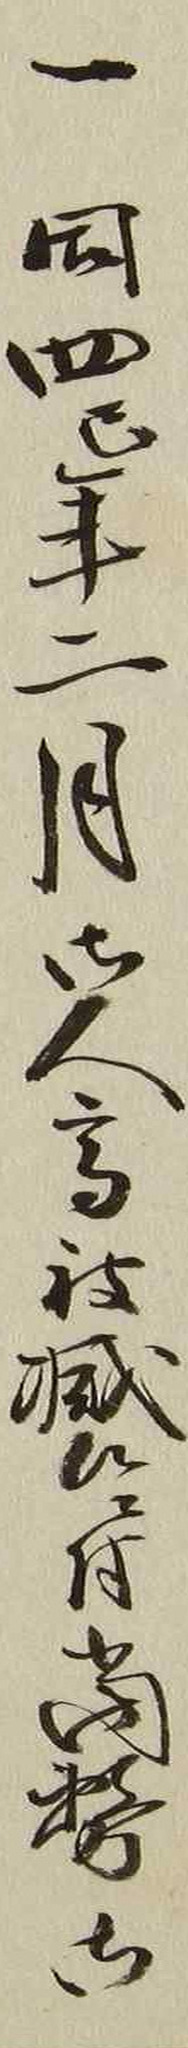一同四巳年二月御人高被減候ニ付当務御
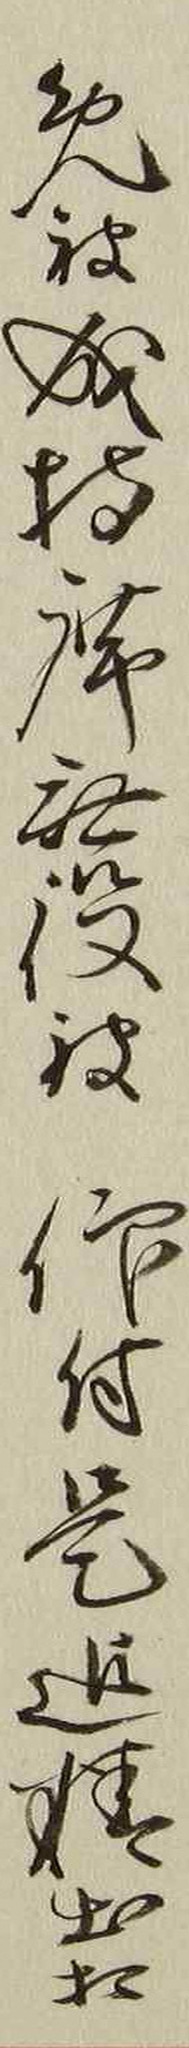免被成持席無役被仰付是迄精出相
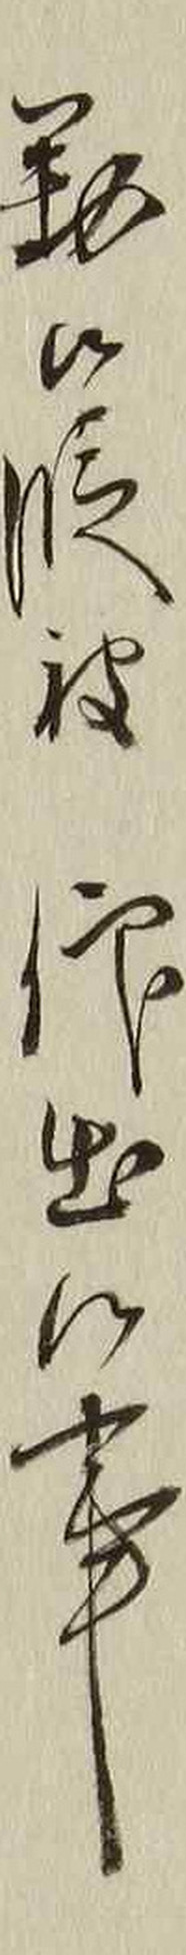勤候段被仰出候事
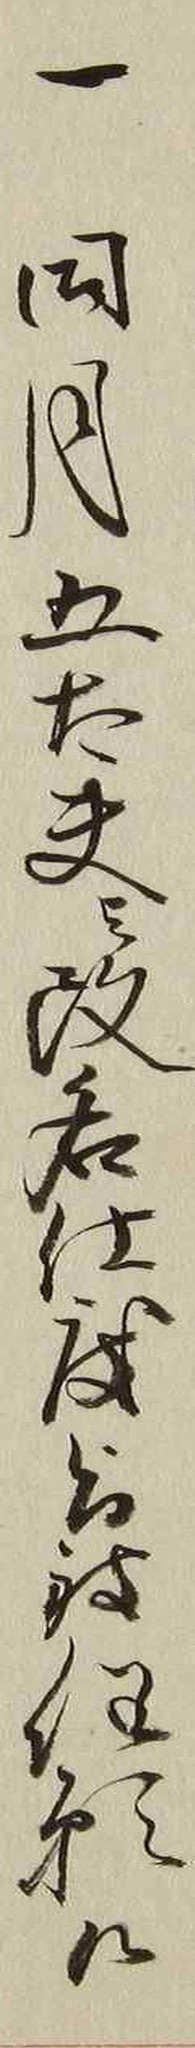一同月五太夫と改名仕度旨被任願候
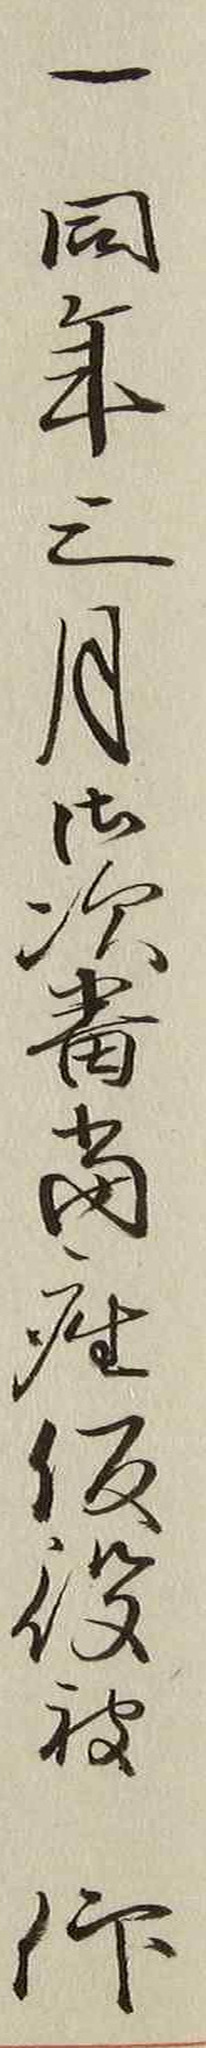一同年三月御次席番当座仮役被仰
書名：諸士系譜　巻之163　な之部5
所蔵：会津若松市立会津図書館
